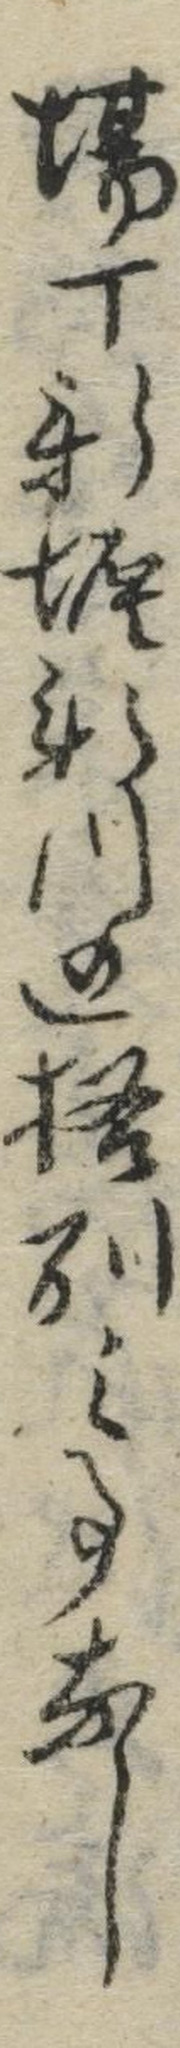場丁新堀新川辺格別之事なし
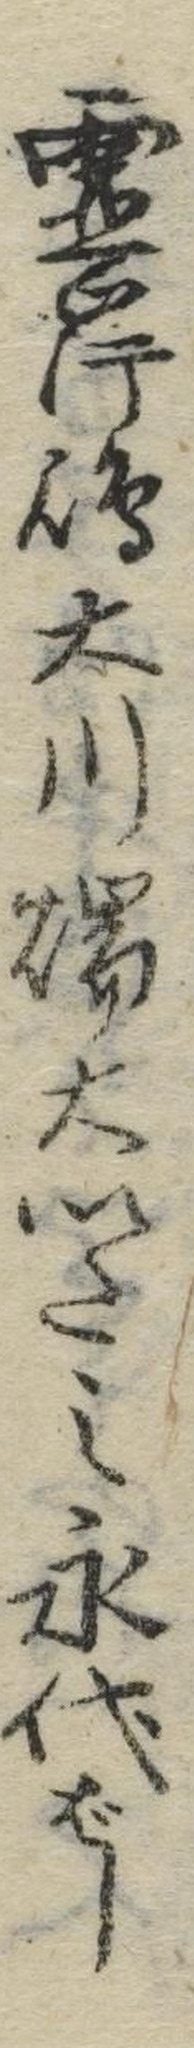霊岸嶋大川端大いたみ永代ばし
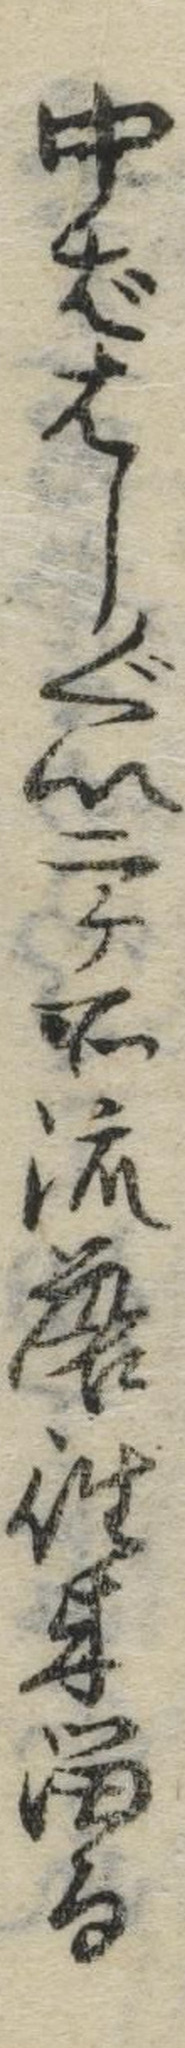中ばはしぐい二ヶ所流落往来溜る
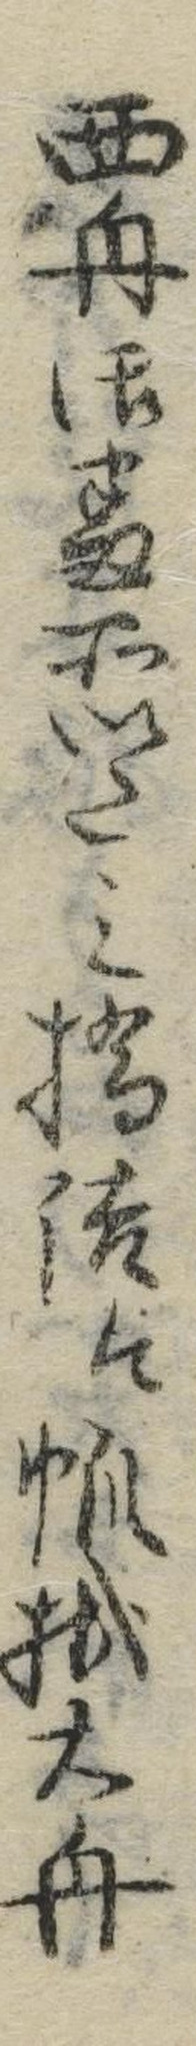西舟御番所いたみ橋詰え帆掛大舟
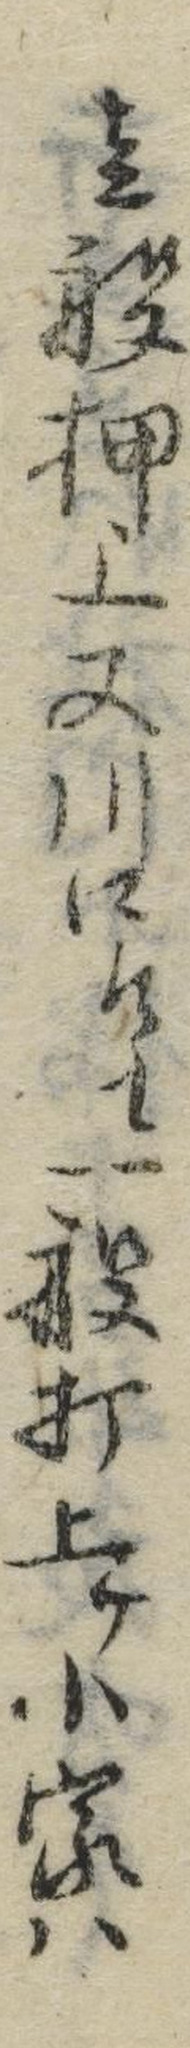壱艘押上又川口えも一艘打上け小家は
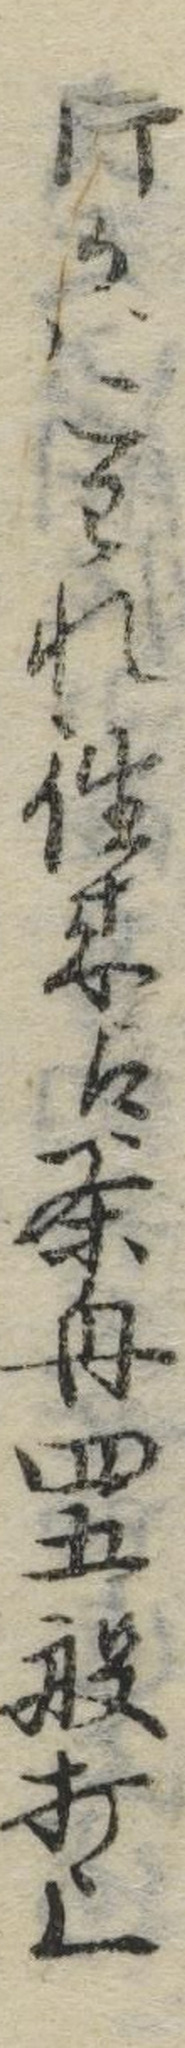片かはこわれ往来え茶舟四五艘打上
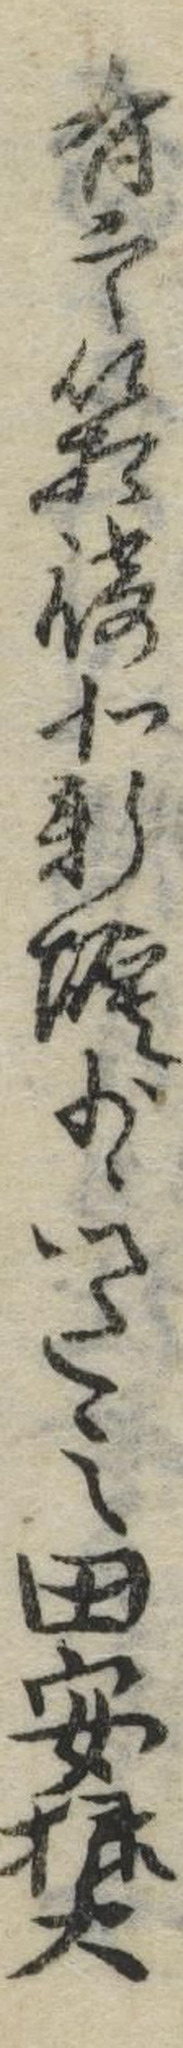有之箱崎北新堀少〻いたみ田安様火
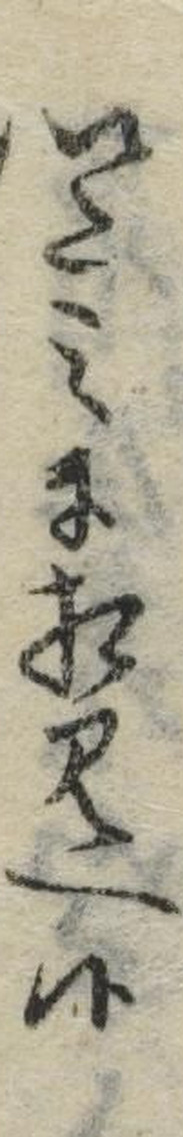いたみに相見へ候
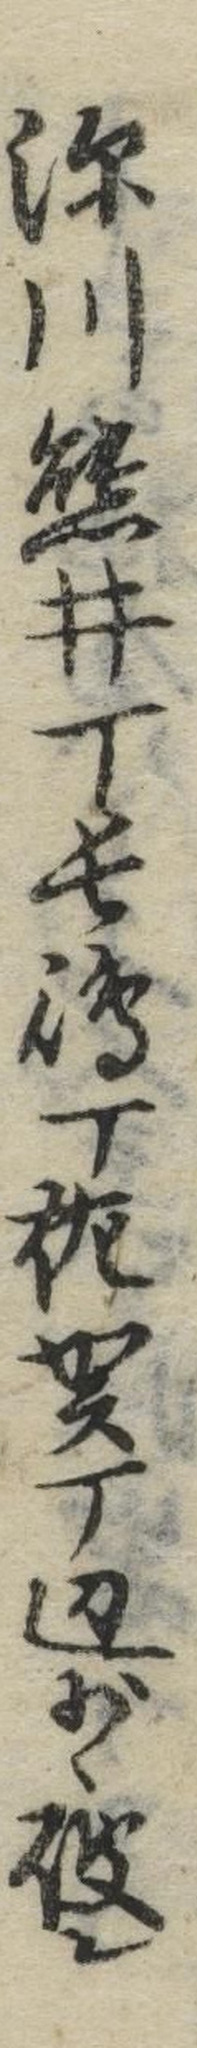深川熊井丁長嶋丁佐賀丁辺少〻破れ
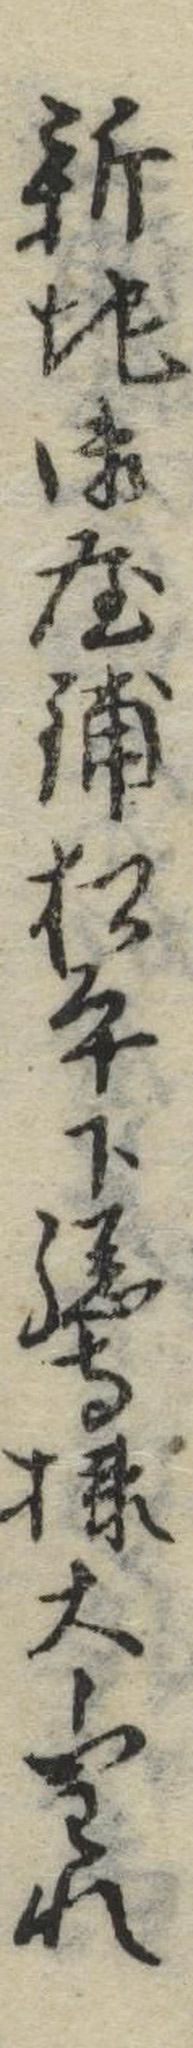新地御屋鋪松平下総守様大こわれ
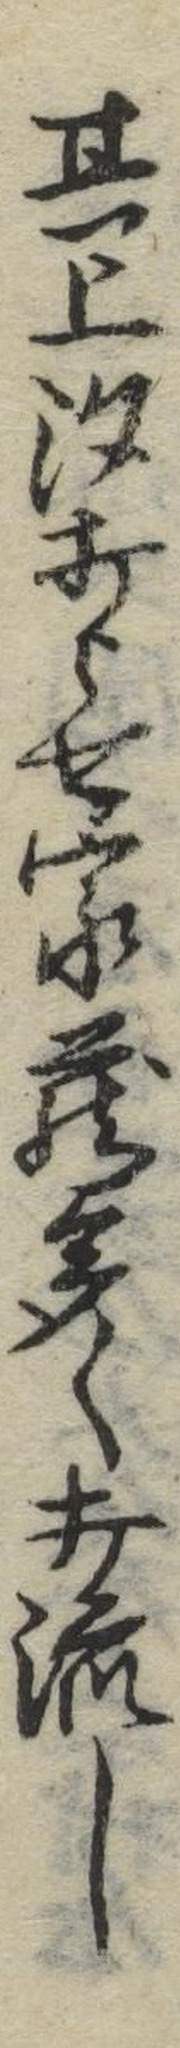其上汐打よせ家蔵多く打流し
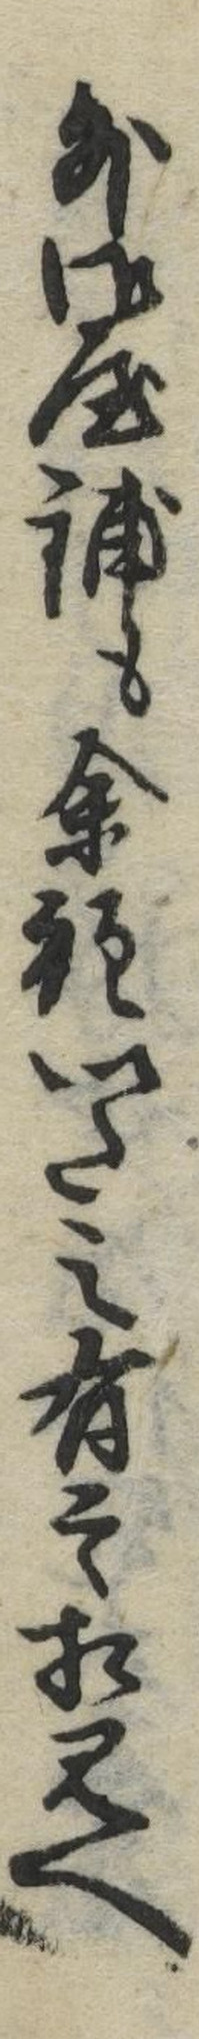外御屋鋪も余程いたみ有之相見へ

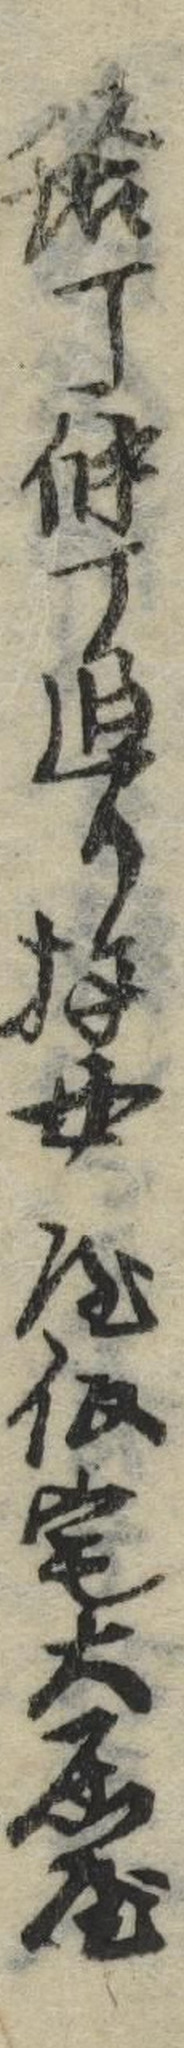蛤丁仲丁通り遊女屋仮宅大黒屋
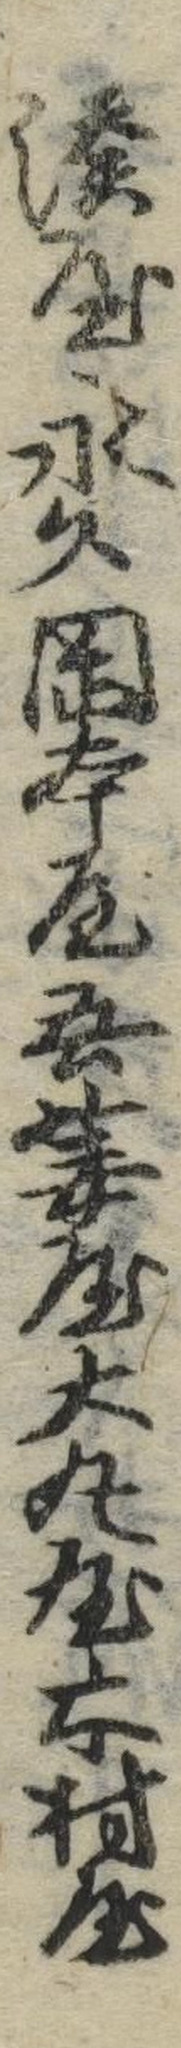湊屋永久岡本屋吾妻屋大丸屋木村屋
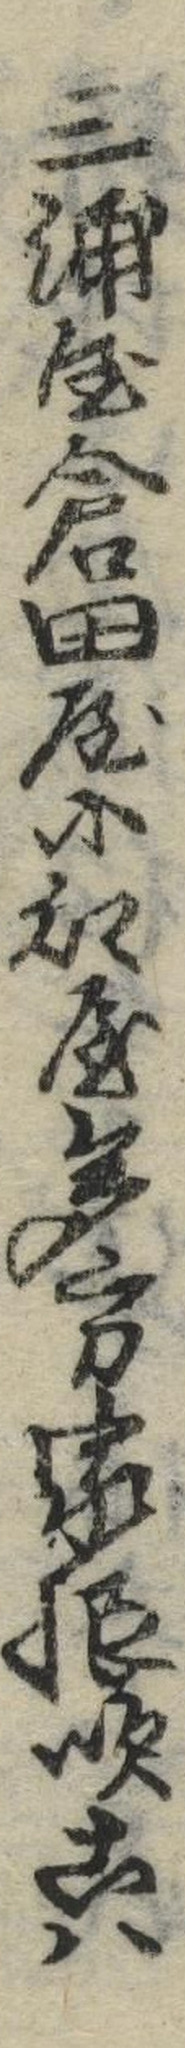三浦屋倉田屋小知屋多方家根吹こハ
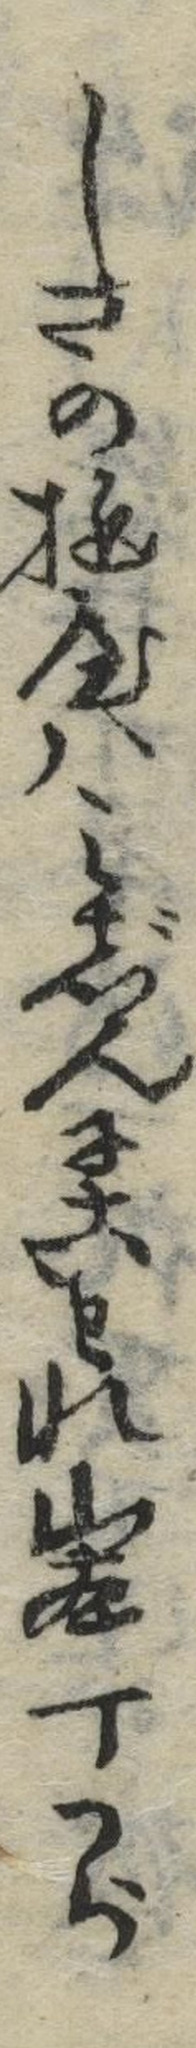しさの槌屋ハミじんにこわれ山本丁から
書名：安政三年辰八月廿五日夜　大江都御屋敷方寺社市中共　大嵐水入場所明細書之寫　并街道筋近郷聞書
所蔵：東京大学地震研究所図書室 Earthquake Research Institute Library, The University of Tokyo, JAPAN
